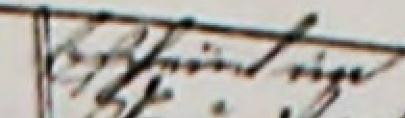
Erscheint im
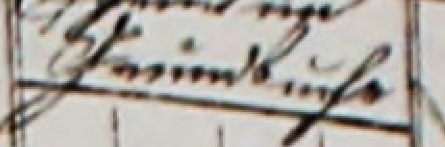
Grundbuche
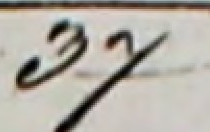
37
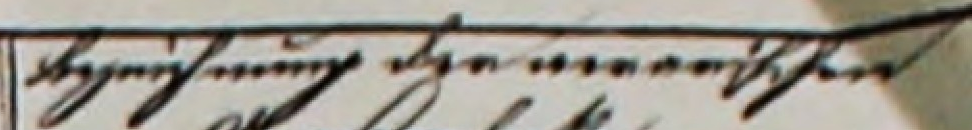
Bezeichnung der aerarischen
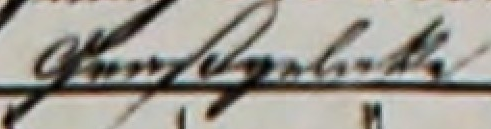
Graßgelake
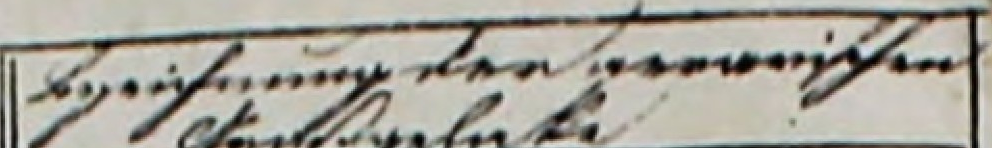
Bezeichnung der aerarischen
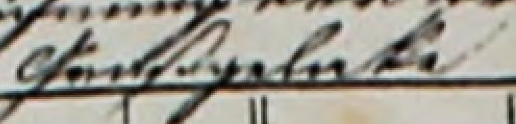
Graßgelake
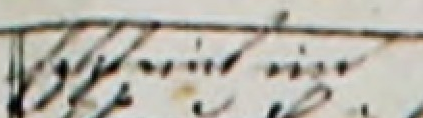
Erscheint im
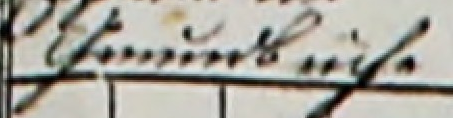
Grundbuche
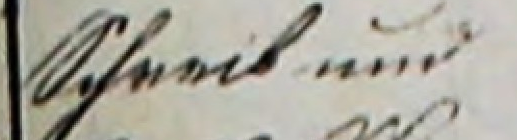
Schreib und
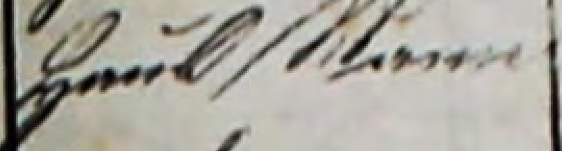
Haus Name
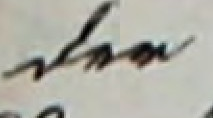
der
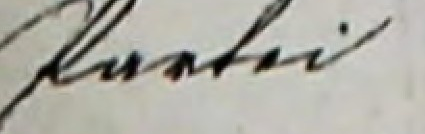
Partei
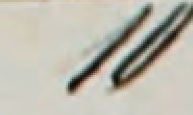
10
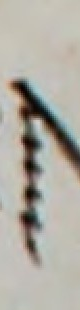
ung
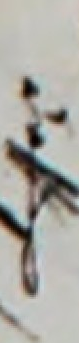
Hnr
